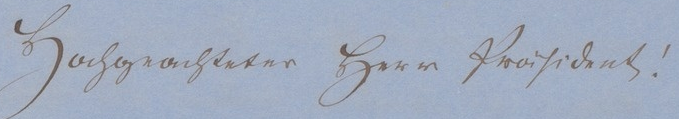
Hochgeachteter Herr Präsident!
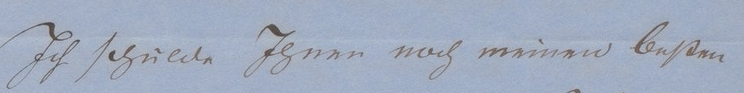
Ich schulde Ihnen noch meinen besten
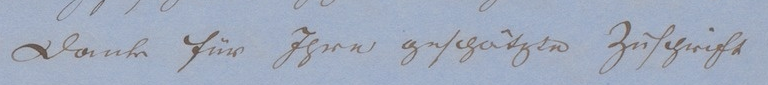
Dank für Ihre geschätzte Zuschrift
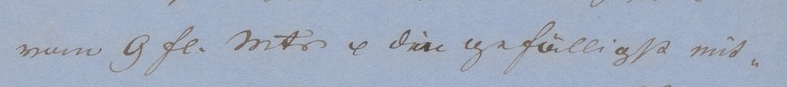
vom 9 fl. Mts & den gefälligst mit-
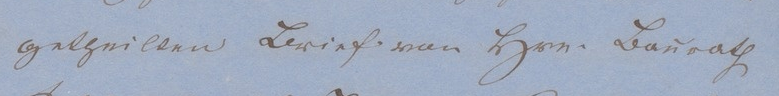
getheilten Brief von Hrn. Baurath
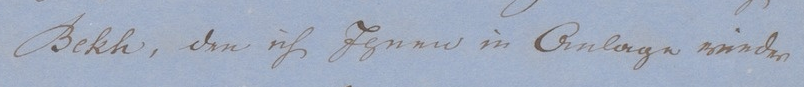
Bekh, den ich Ihnen in Anlage wieder
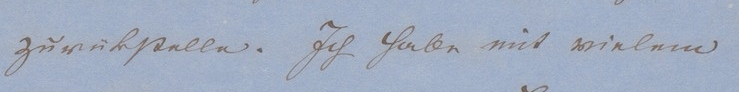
zurükstelle. Ich habe mit vielem
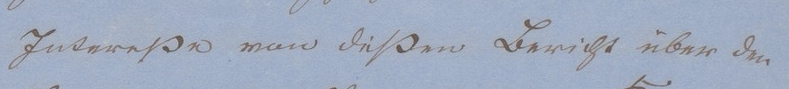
Intereße von deßen Bericht über den
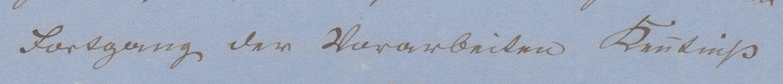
Fortgang der Vorarbeiten Kenntniß
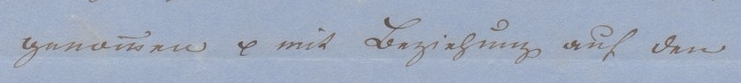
genommen & mit Beziehung auf den
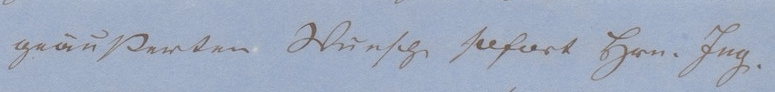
geäußerten Wunsch sofort Hrn. Ing.
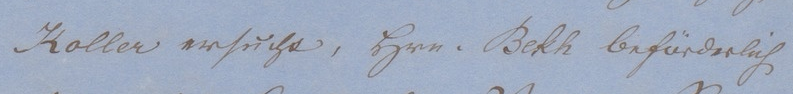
Koller ersucht, Hrn. Bekh beförderlich
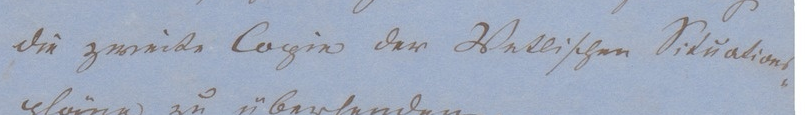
die zweite Copie der Wetlischen Situations-
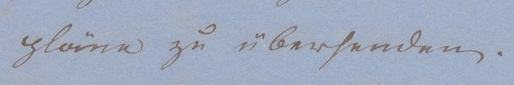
pläne zu übersenden. –
